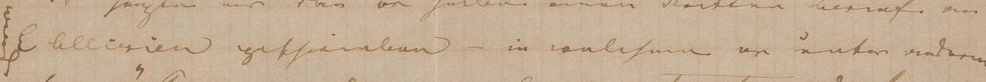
E Ollivier geschriebenen – in welchem er unter anderm
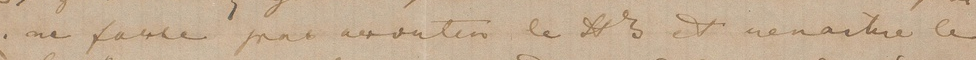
ne fasse pas arreter le St G et renaitre le
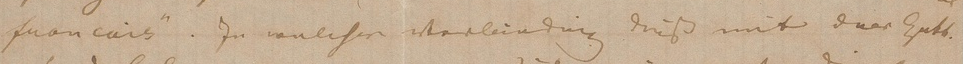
francais ». In welcher Verbindung dieß mit der Gott-
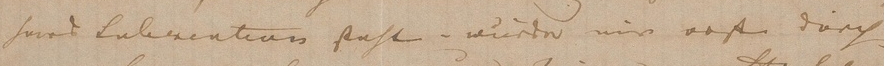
hard Subvention steht – wurde mir erst durch
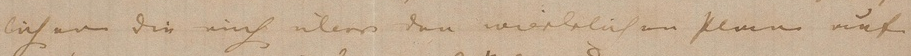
lichen die mich über den wirklichen Plan auf-
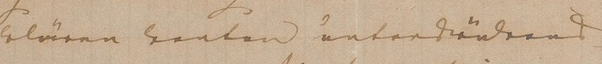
klären konten unterdrükend. –
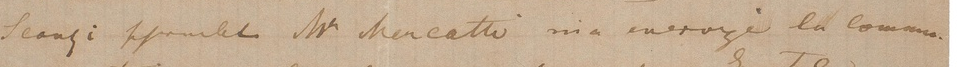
Scanzi schreibt MrMercatti ma envoyé la commu-
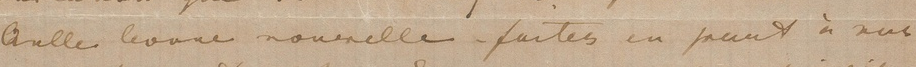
Quelle bonne nouvelle – faites un peut à nos
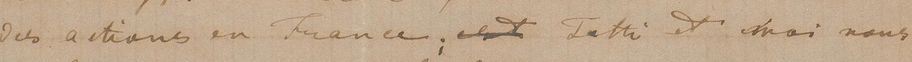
des actions en France; estTatti et moi nous
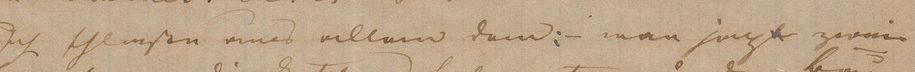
Ich schließe aus allem dem: – man jagt zwei
